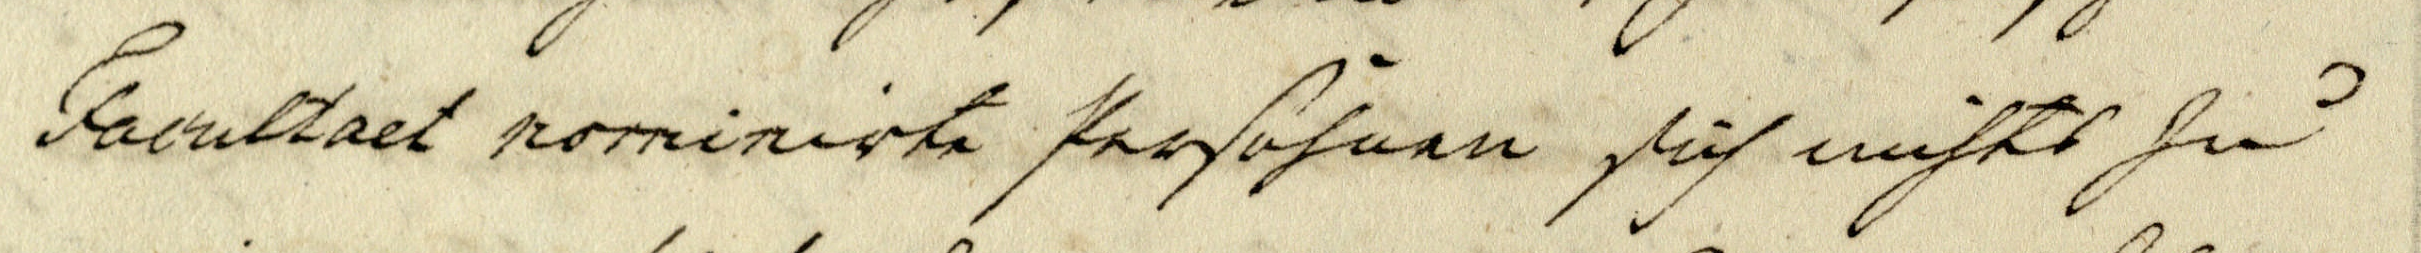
Facultaet nominirte Persohnen sich nichts zu
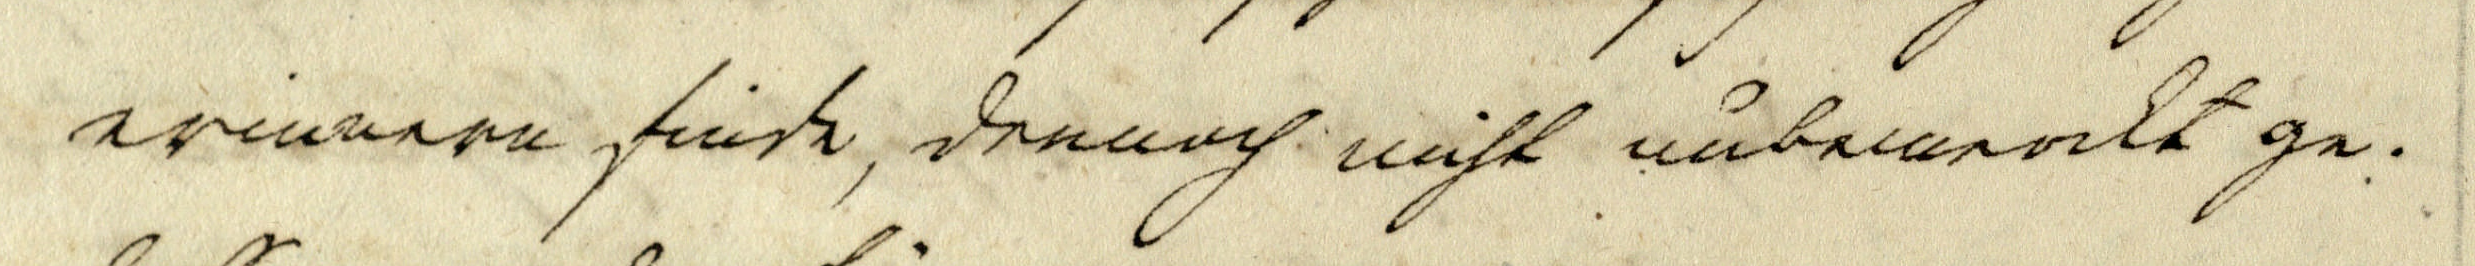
erinnern finde, dennoch nicht unbemerckt ge¬
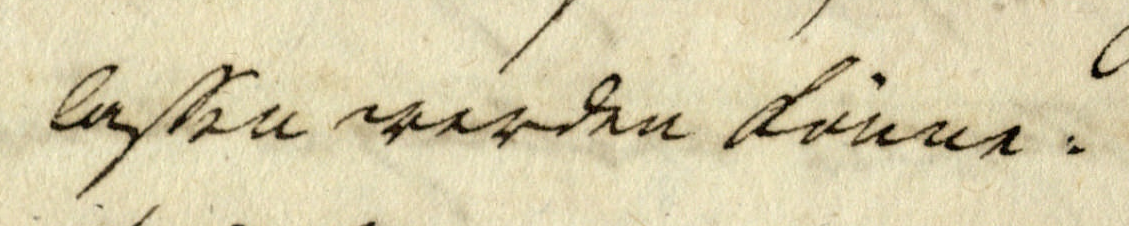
lassen werden könne:
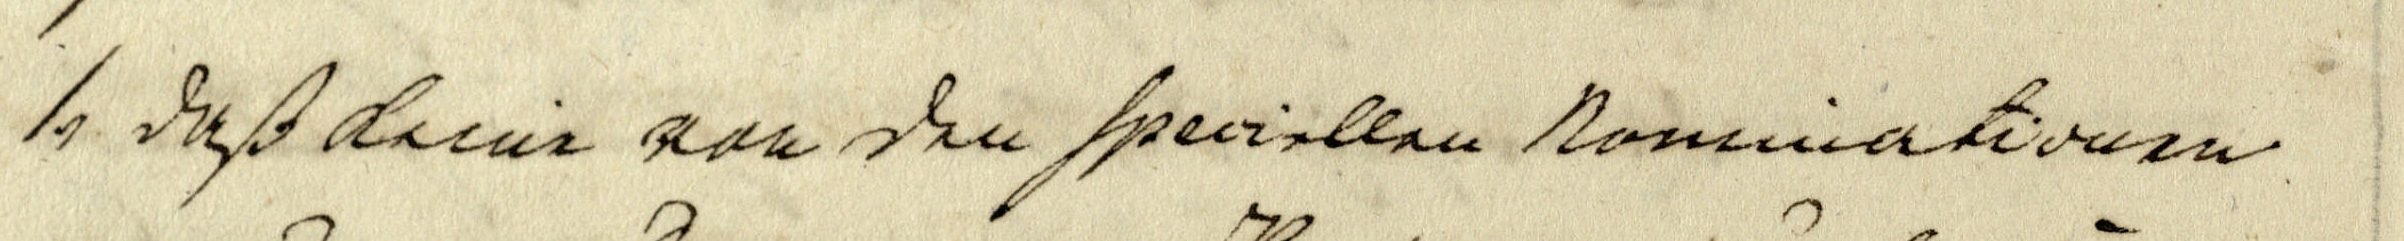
1, daß keine von den speciellen Nominationen
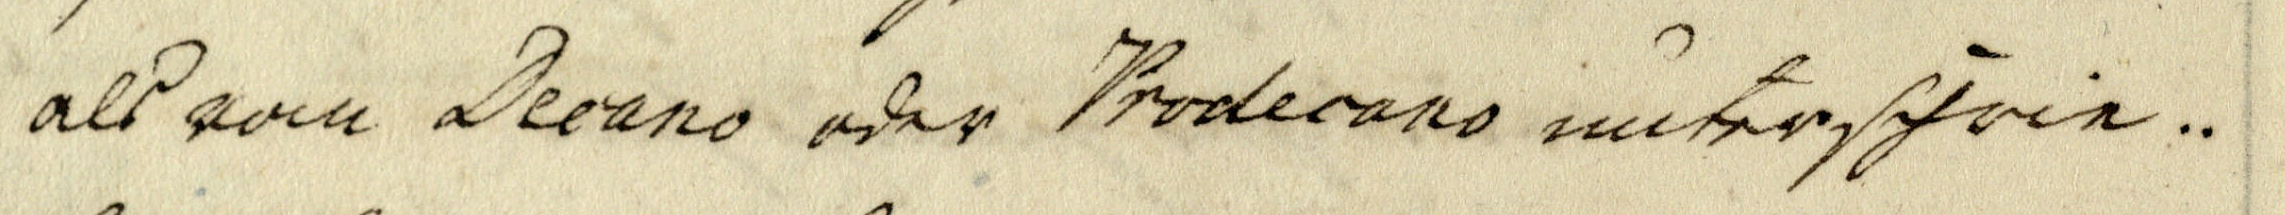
als vom Decano oder Prodecano unterschrie¬
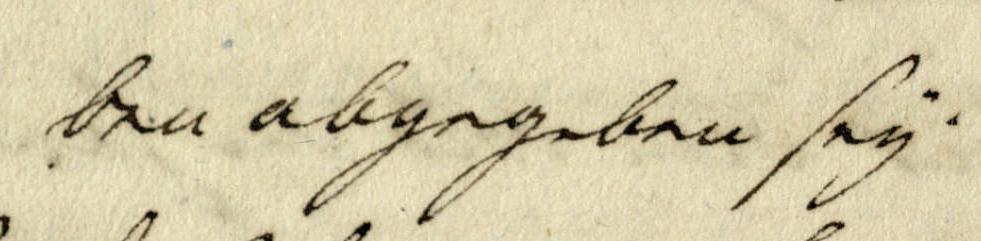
ben abgegeben seÿ.
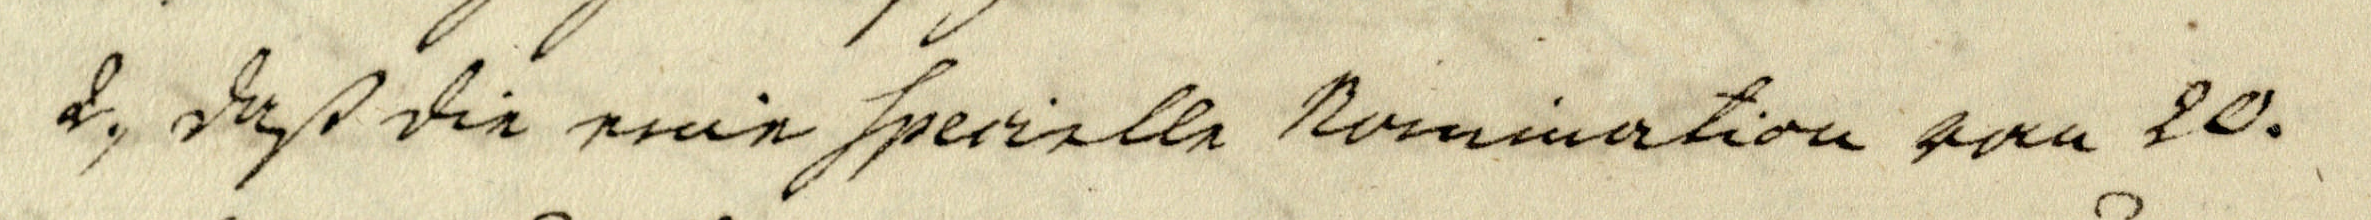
2., daß die eine specielle Nomination vom 20.
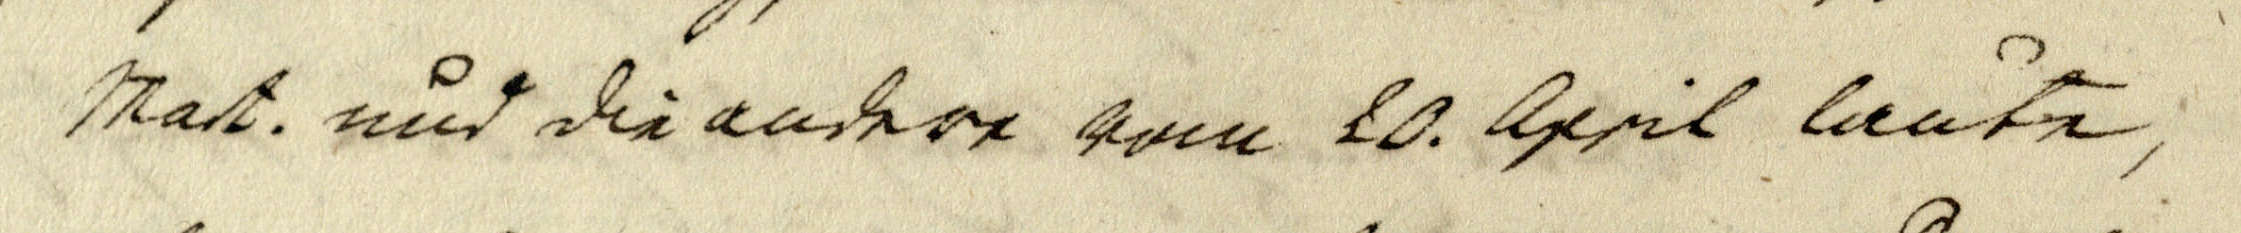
Mart. und die andere vom 20. April laute,
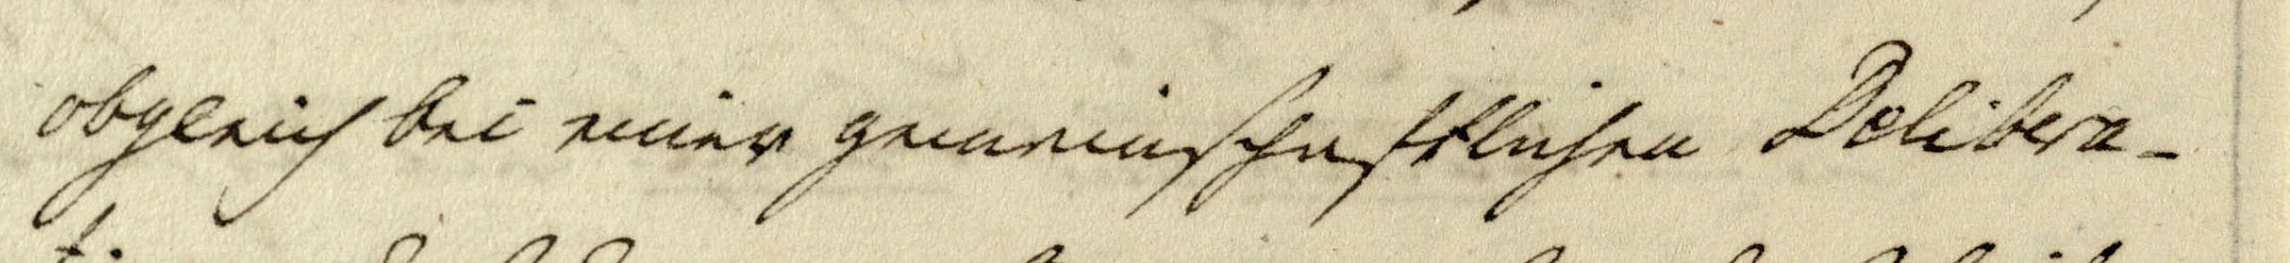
obgleich bei einer gemeinschftlichen Delibera¬
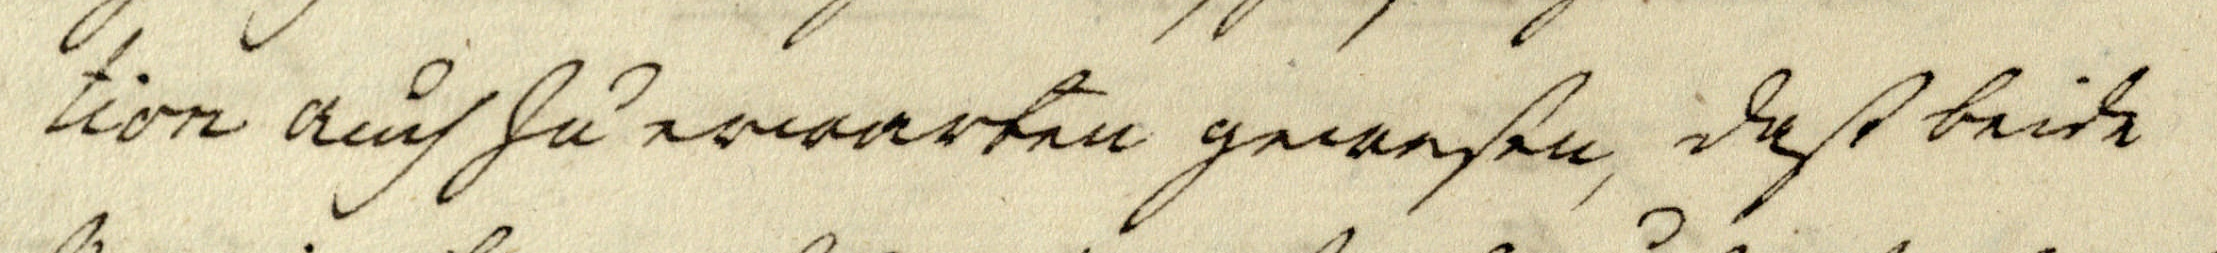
tion auch zu erwarten gewesen, daß beide
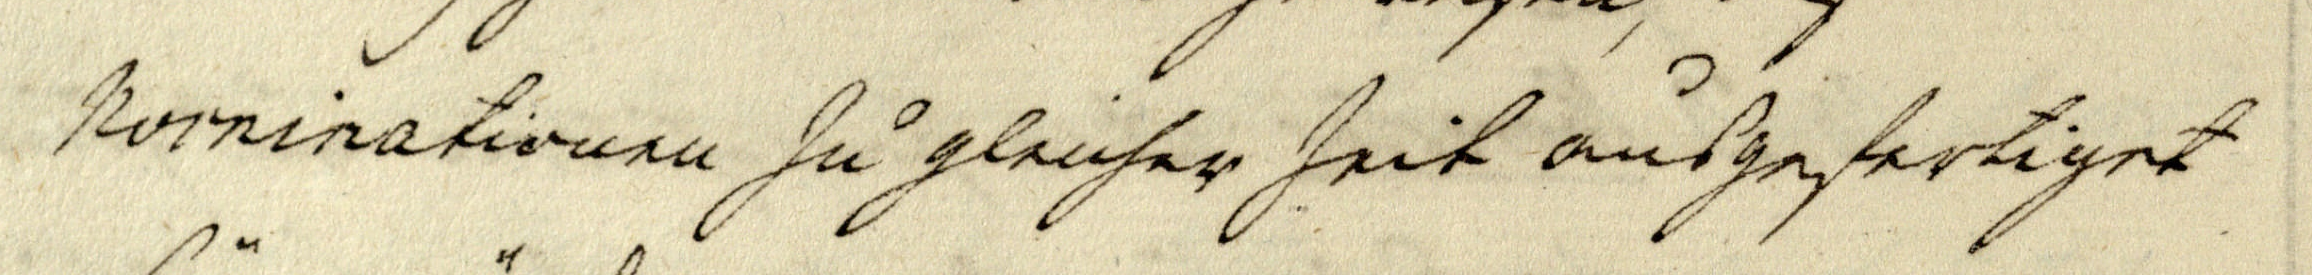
Nominationen zu gleicher Zeit ausgefertiget
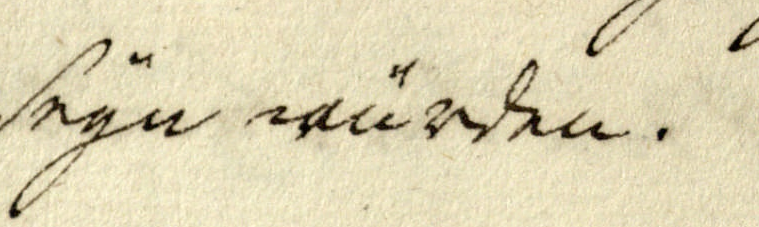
seÿn würden.
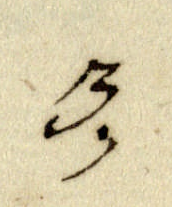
3.,
